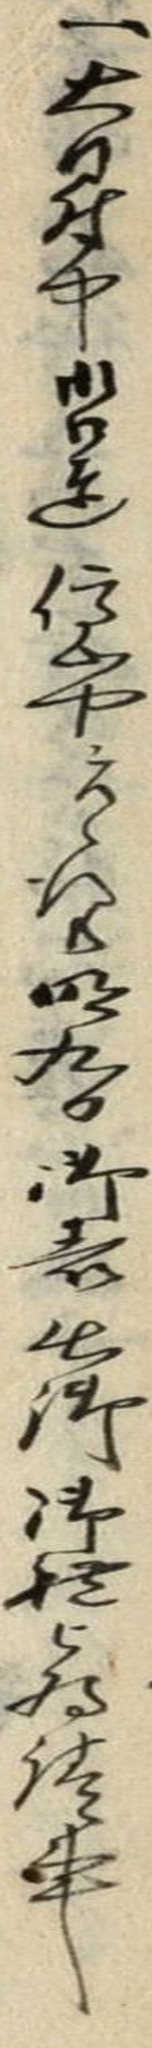一大目付中御口達停止中には候得共明九日御表出御御礼被為請候事
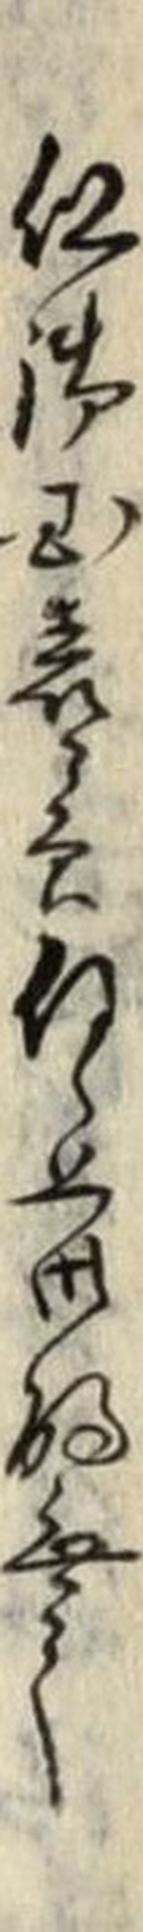但御国表にては伺之上御触無之
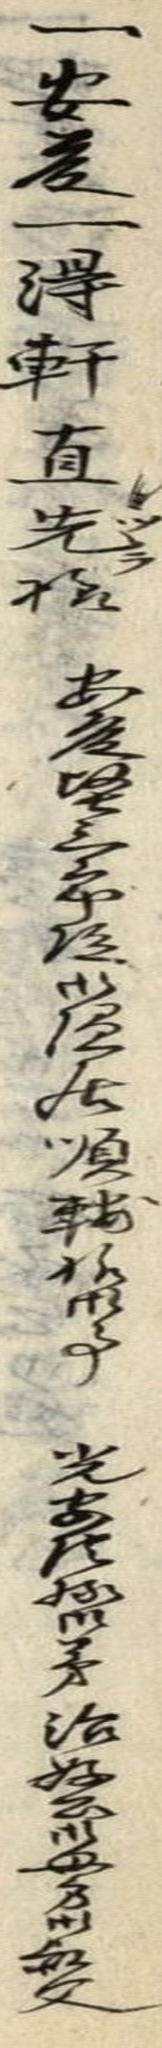一安藤一得軒直先様安藤堅三郎殿御隠居順輔様御事光安院様御弟治好公御母方御叔父
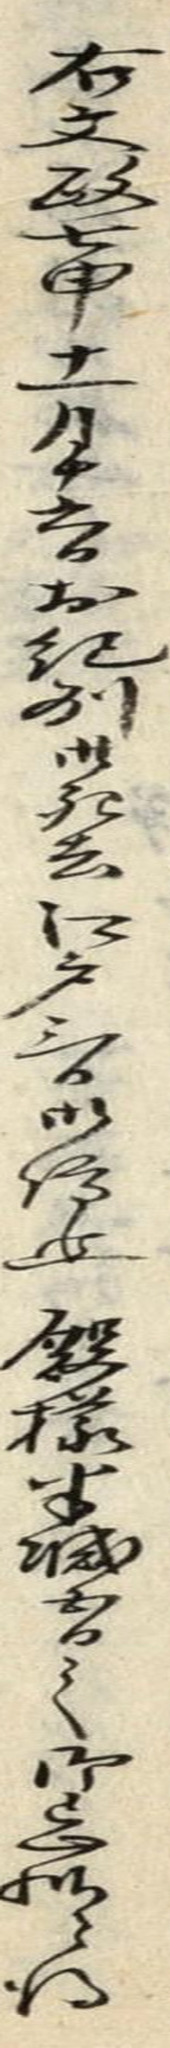右文政七申十一月十六日於紀州御死去江戸三日御停止殿様半減五日之御忌掛りに候得
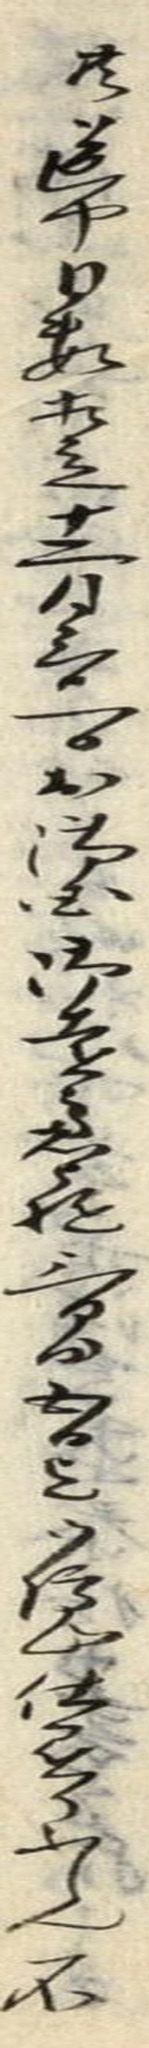共道中日数相立十二月三日一日於御国御遠慮被遊三日ゟ五日迄御停止仕懸りふしん不
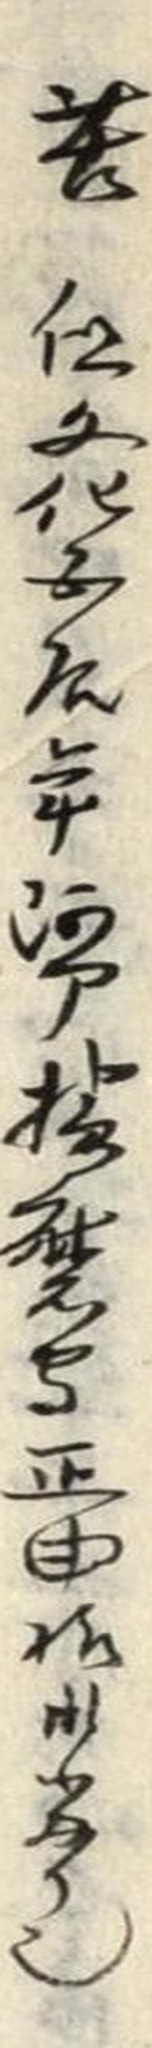苦但文化五辰年阿部播磨守正由様御当り也
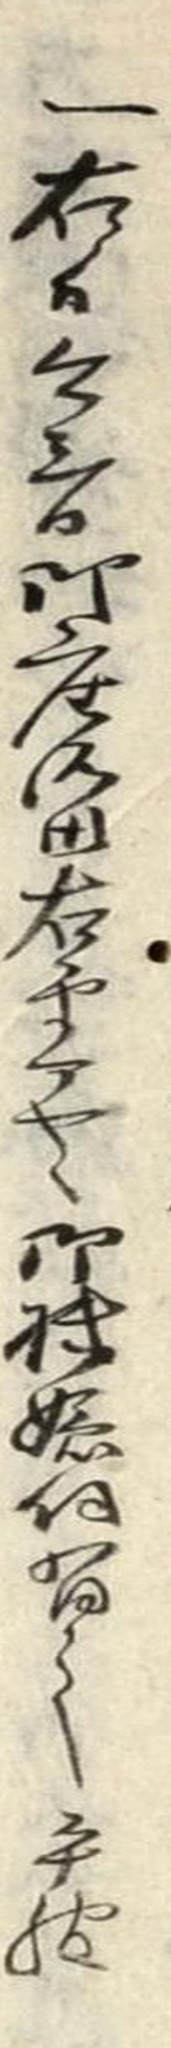一右に付今三日御座所御右筆部やへ御機嫌伺有之平服
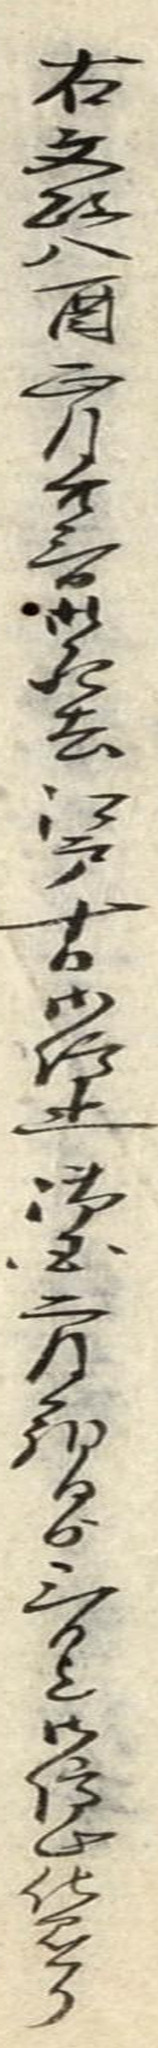右文政八酉正月廿三日御死去江戸十日御停止御国二月朔日ゟ三日迄御停止仕懸り
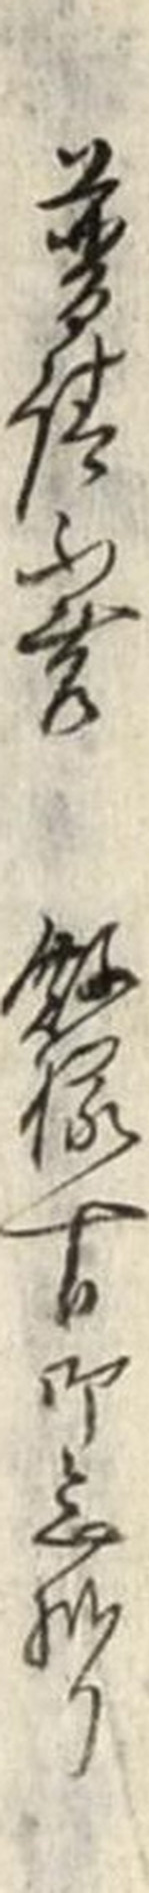普請不苦殿様十日御忌掛り
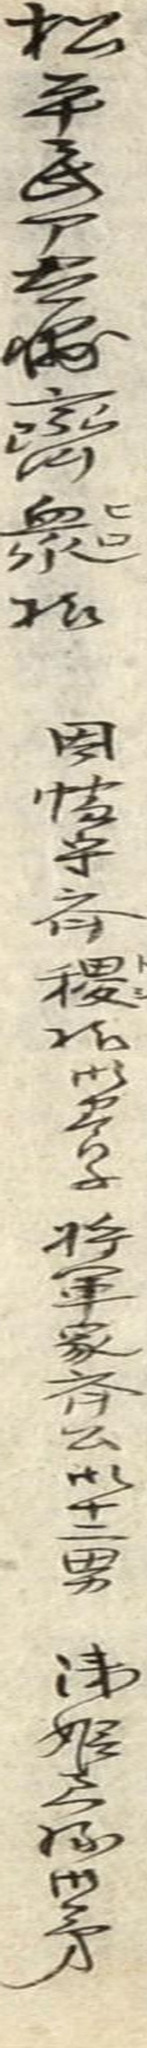一松平民部大夫斉衆様因幡守斉稷様御養子将軍家斉公御十二男浅姫君様御弟
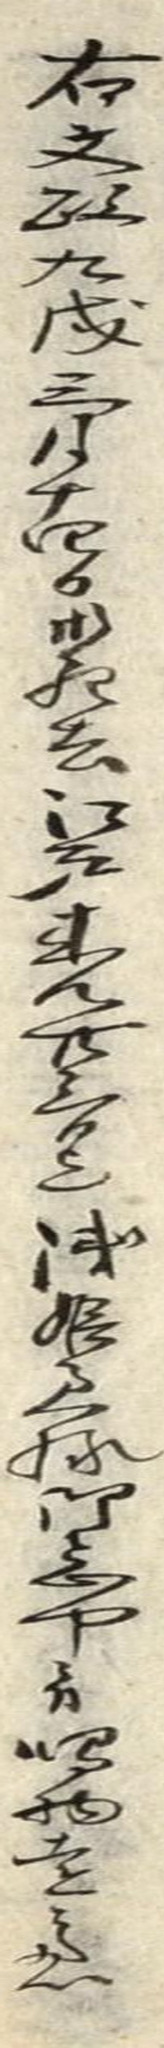右文政九戌三月十四日御死去江戸来ル廿三日迄浅姫君様御忌中に付鳴物遠慮
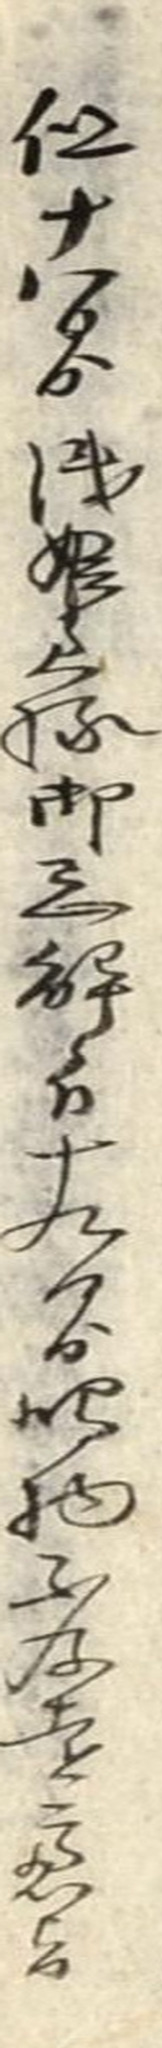但十八日ゟ浅姫君様御忌解に付十九日ゟ鳴物不及遠慮旨
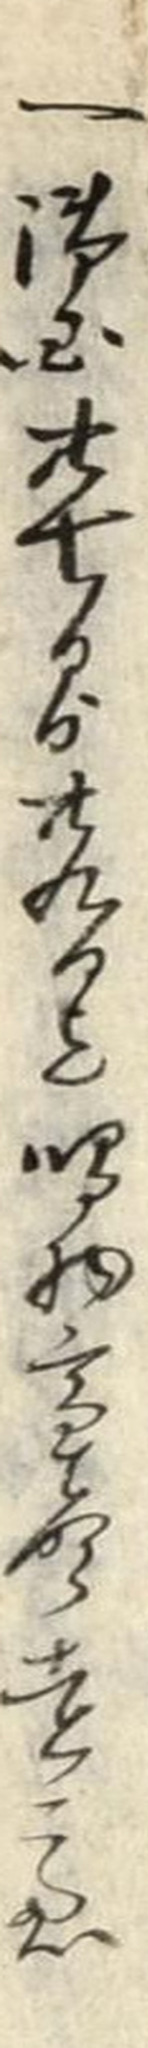一御国廿七日ゟ廿九日迄鳴物高声遠慮

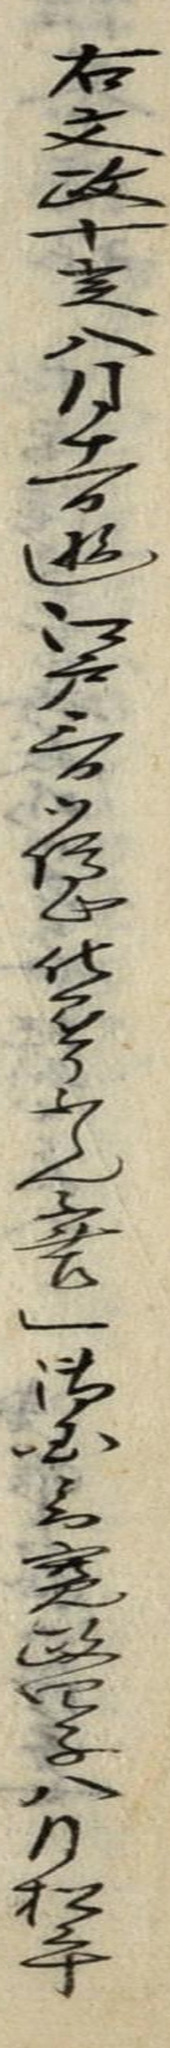右文政十亥八月十一日逝江戸三日御停止仕懸りふしん不苦」御国にて寛政四子八月松平
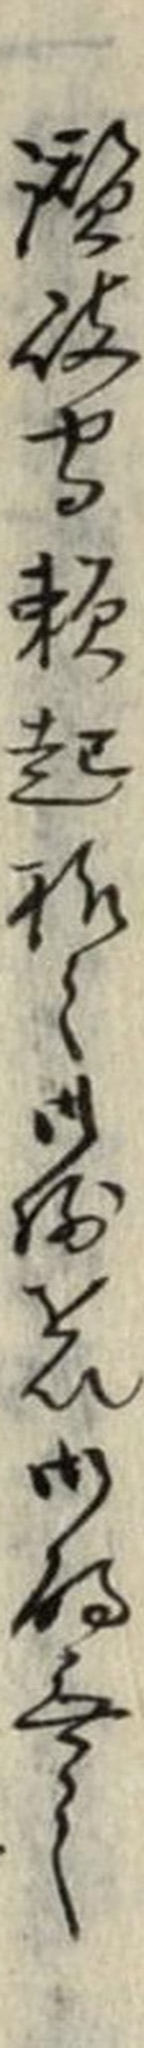讃岐守頼起様之御例を以御触無之
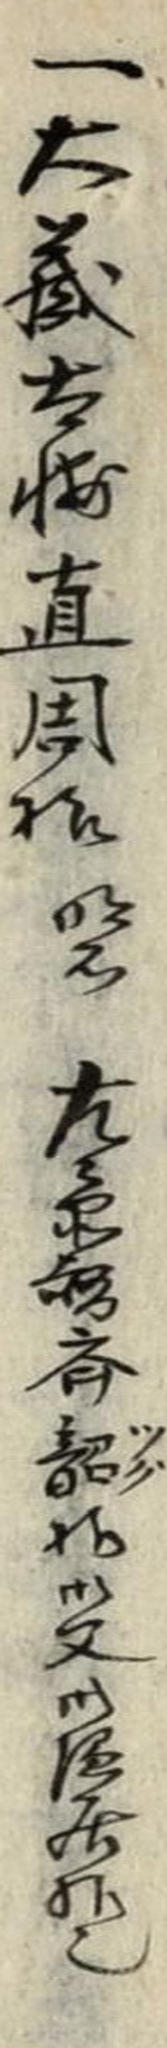一大蔵太輔直周様明石左兵衛督斉韶様御父御隠居様也
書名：御停止異変死失
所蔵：福井県文書館 Fukui Prefectural Archives
